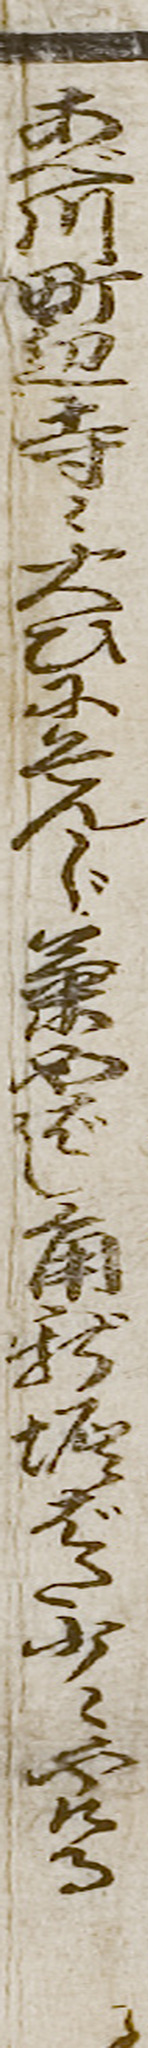あべ川町辺寺々大ひにそんじ菊やばし角新堀ばた少々やける
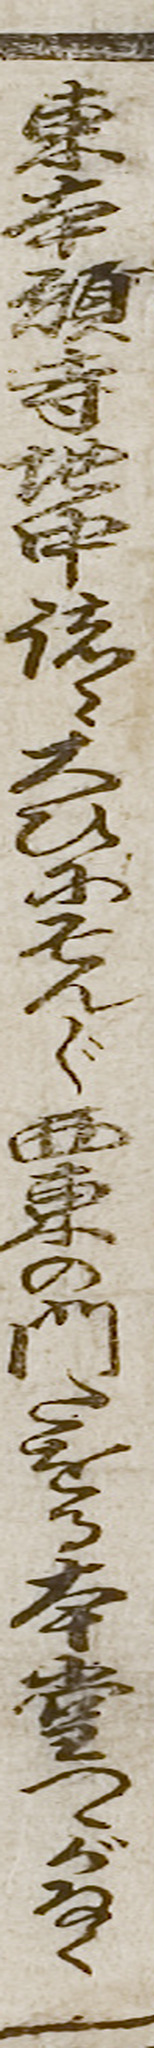東本願寺地中諸々大ひにそんじ西東門たをる本堂つゝがなく
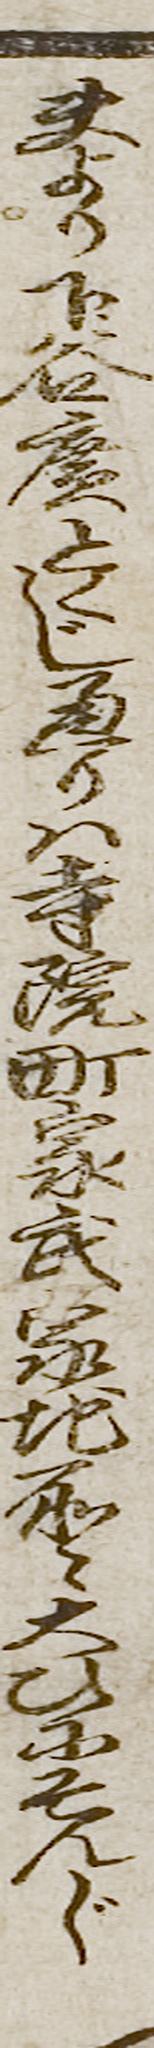夫れより下谷広とくじ通りハ寺院町家民家地所々大ひにそんじ
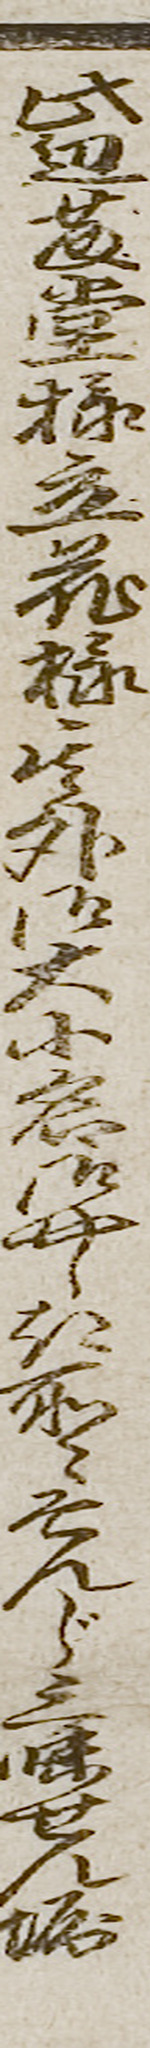此辺藤堂様立花様其外御大小名御やしき所々そんじ三味堀
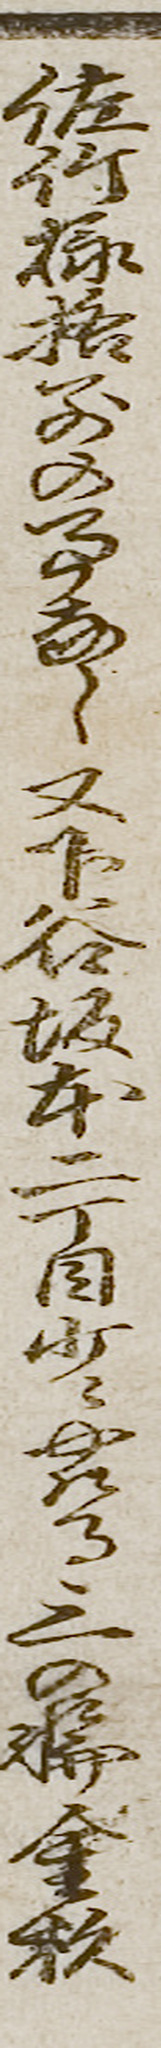佐竹様格別の事なし又下谷坂本二丁目少々やける三の輪金杦
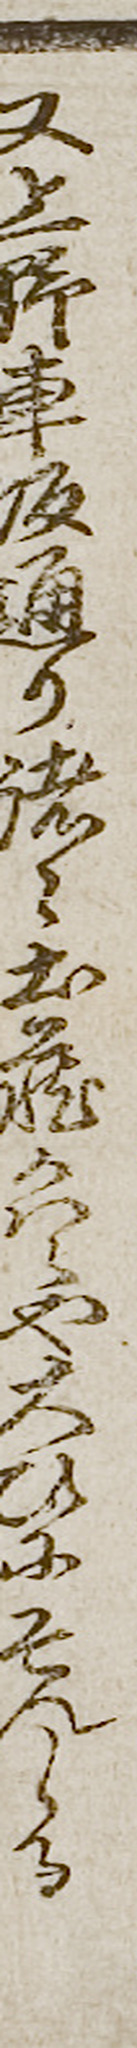又上野車坂通り諸々土蔵かハらや大ひにそんじる
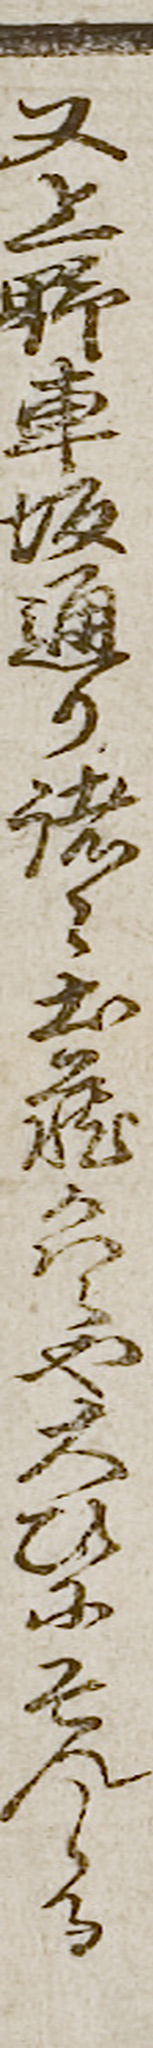又上野車坂通り諸々土蔵かハらや大ひにそんじる
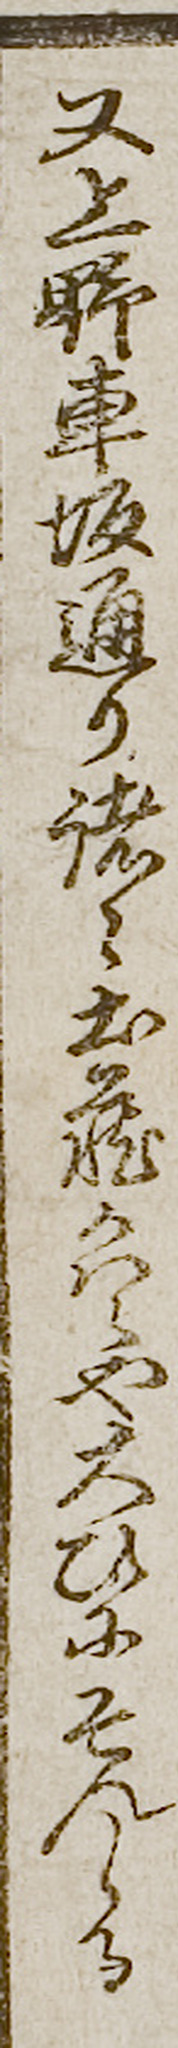又上野車坂通り諸々土蔵かハらや大ひにそんじる
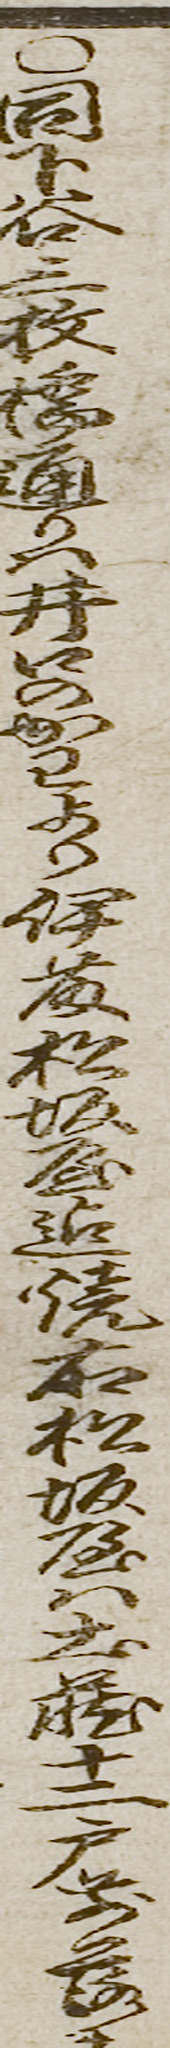○同下谷三枚橋通りハ井口のかわより伊藤松坂屋迄焼右松坂屋ハ土蔵十二戸前落す
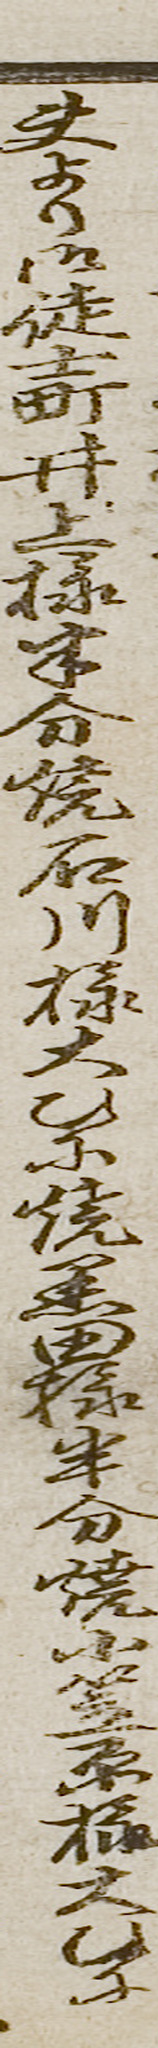夫より御徒町井上様半分焼石川様大ひに焼黒田様半分焼小笠原様大ひに
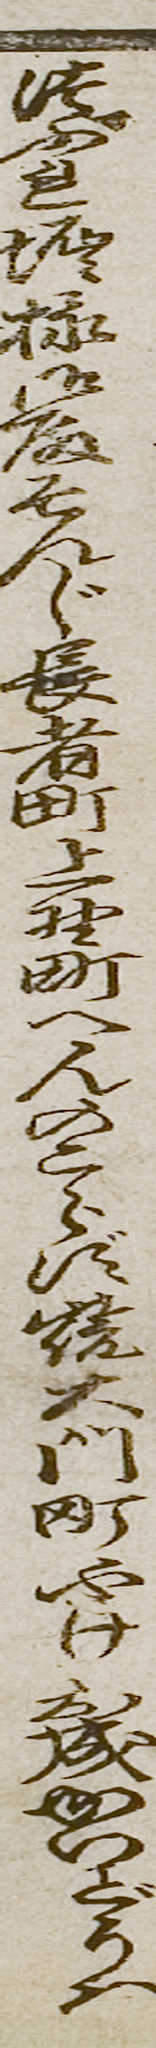つぶれ堀様御殿そんじ長者町上野町へんのこらず焼大門町やけお成かいどうハ
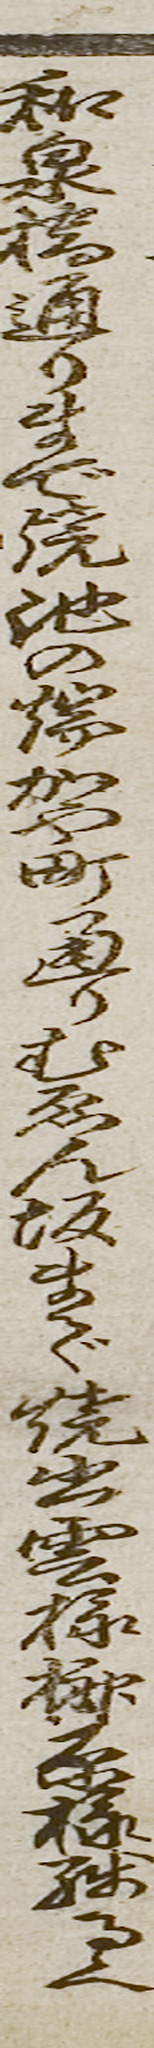和泉橋通りまで焼池の端かや町通りむえん坂まで焼出雲様榊原様残る也
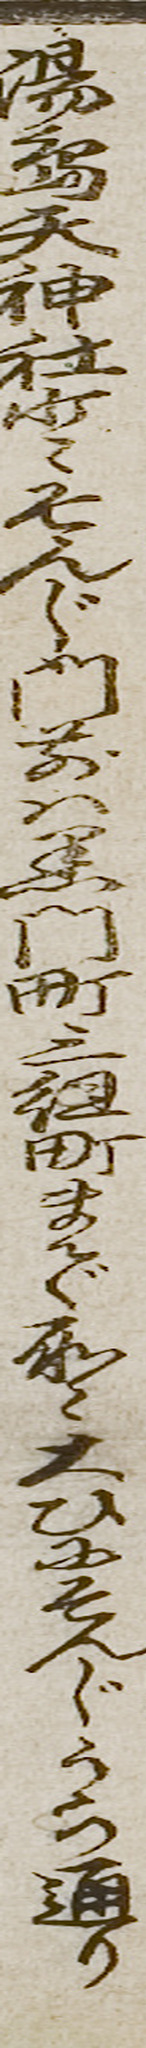湯島天神社少々そんじ門前ハ黒門町三組町まで所々大ひにそんじうら通り
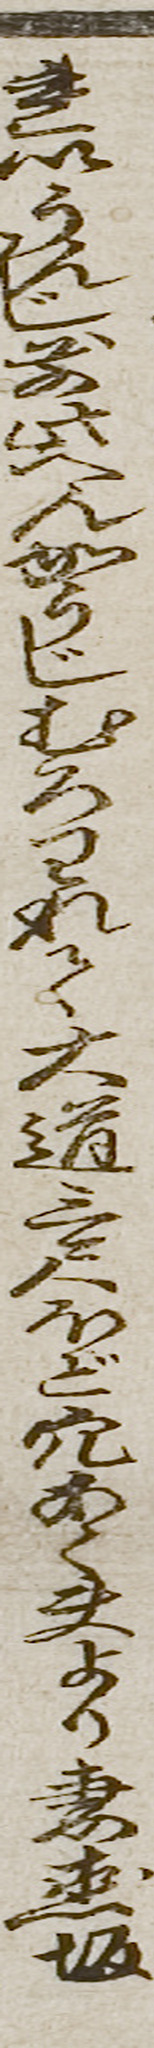れいうんじ前此へんかうじむろわれて大道三尺ほど穴あく夫より妻恋坂
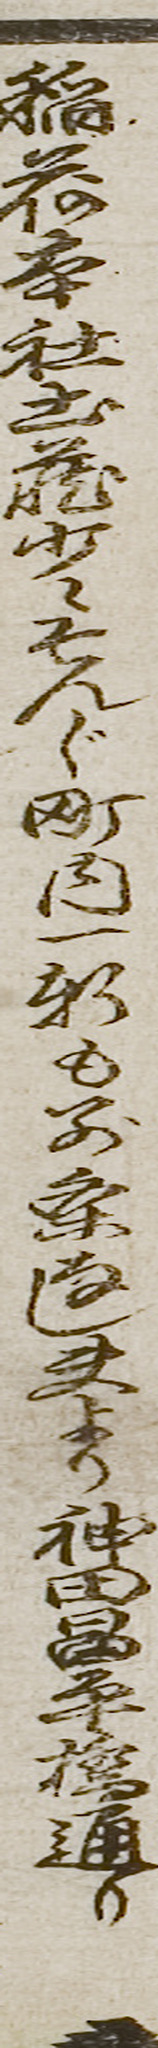稲荷本社土蔵少々そんじ町内一軒も別条なし夫より神田昌平橋
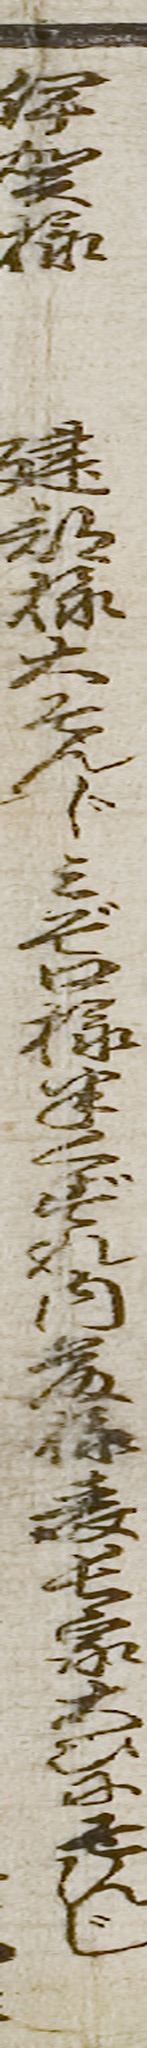伊賀様建部様大そんじみぞ口様半くずれ内藤様表長家大ひにそんじ
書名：江戸大地震出火場所分
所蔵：東京大学総合図書館 General Library in the University of Tokyo, JAPAN
